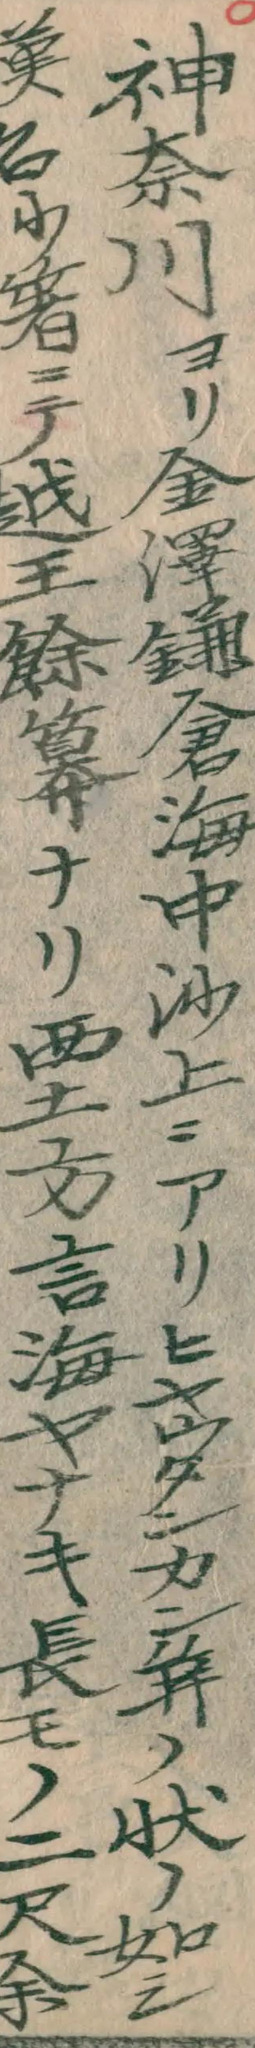漢名沙箸ニテ越王餘西土方言海ヤナキ長モノ二尺余
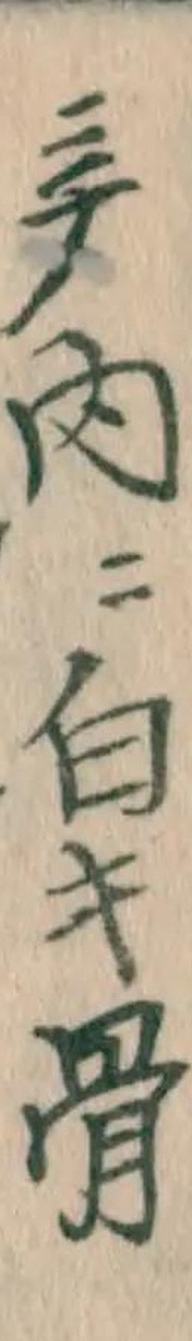ニテ内ニ白キ骨
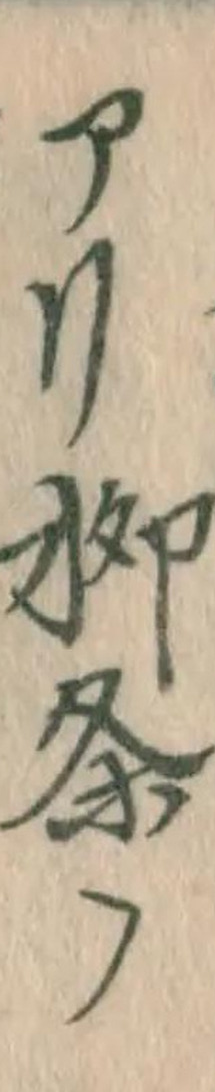アリ柳条ノ

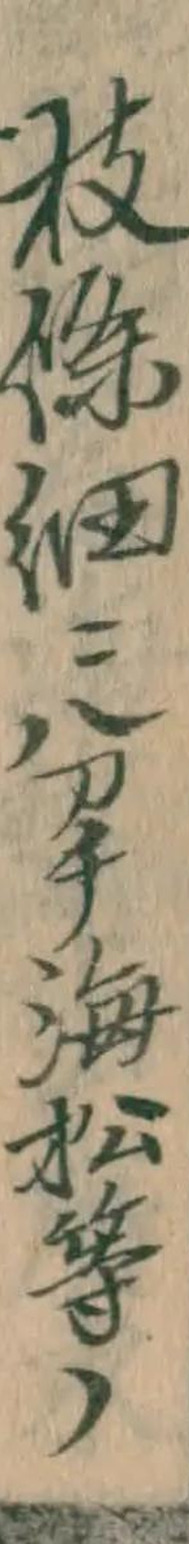枝條細ニ分チ海松等ノ
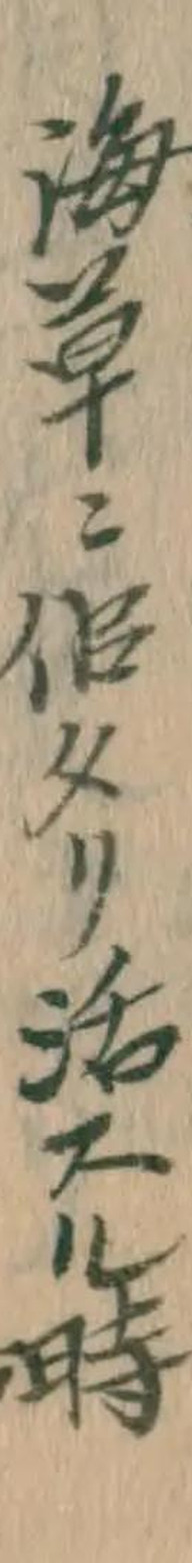海草ニ佀タリ活スル時
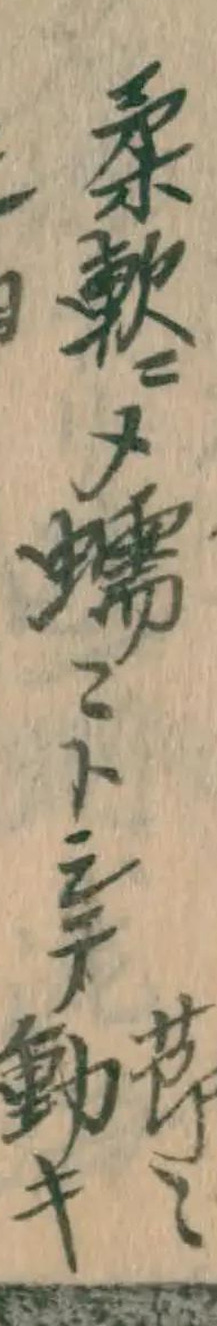柔軟ニシテ蠕々トシテ動キ
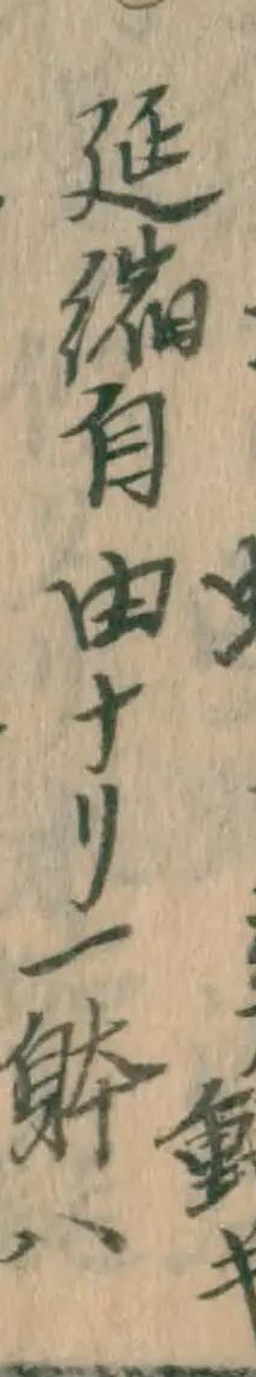延縮自由アリ一躰ハ
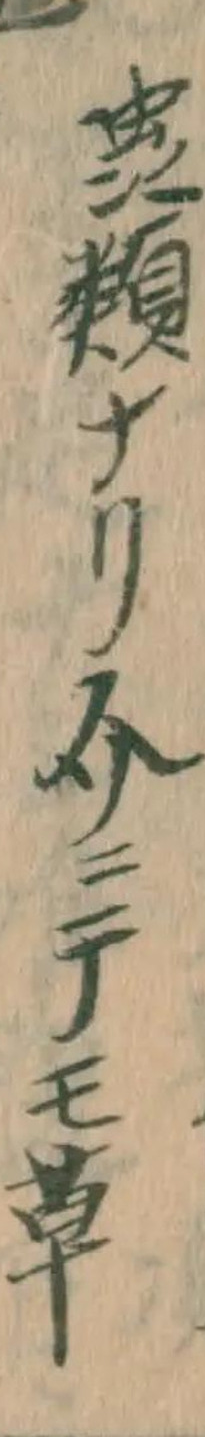蟲類ナリ介ニテモ草
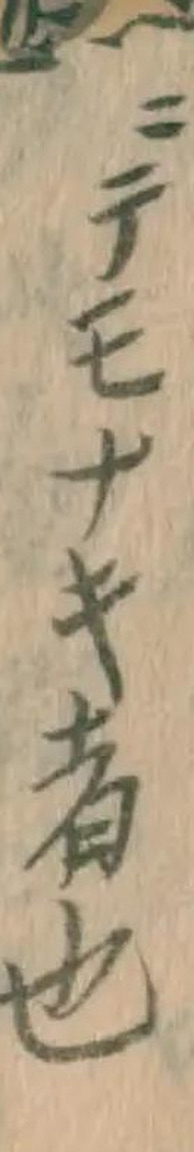ニテモナキ者也
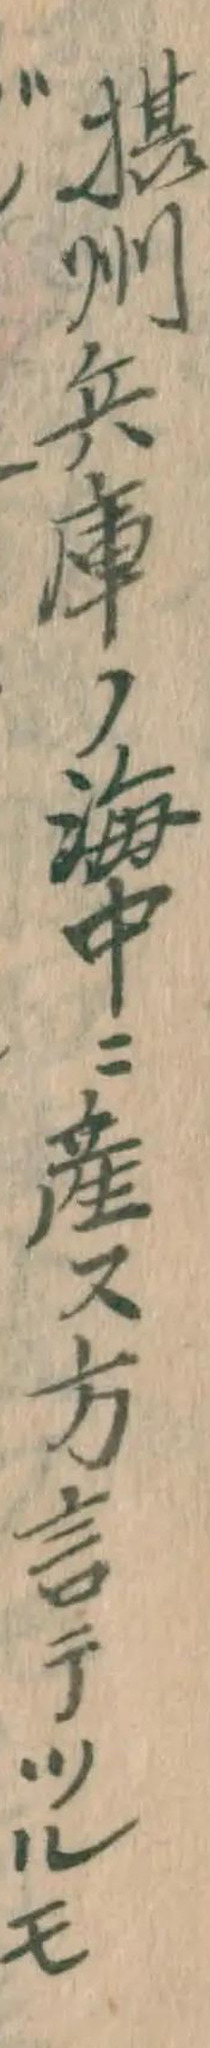摂州兵庫ノ海中ニ産ス方言テツルモ
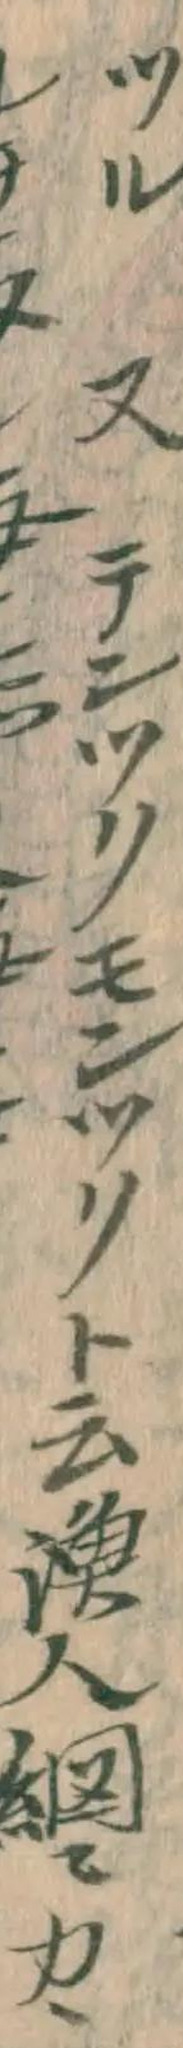ヅル又テンツクモンツクト云漁人網ニカヽ
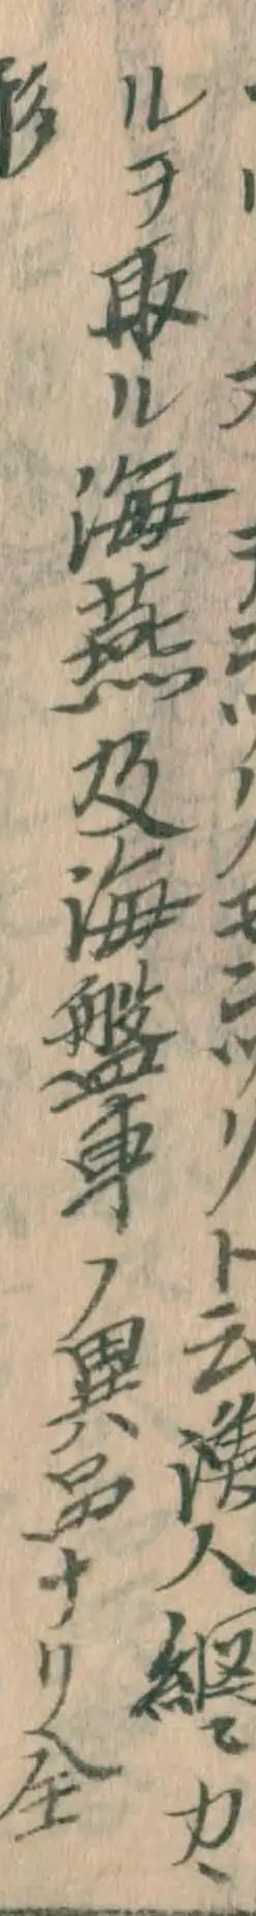ルヲ取ル海燕及海盤車ノ異品ナリ全

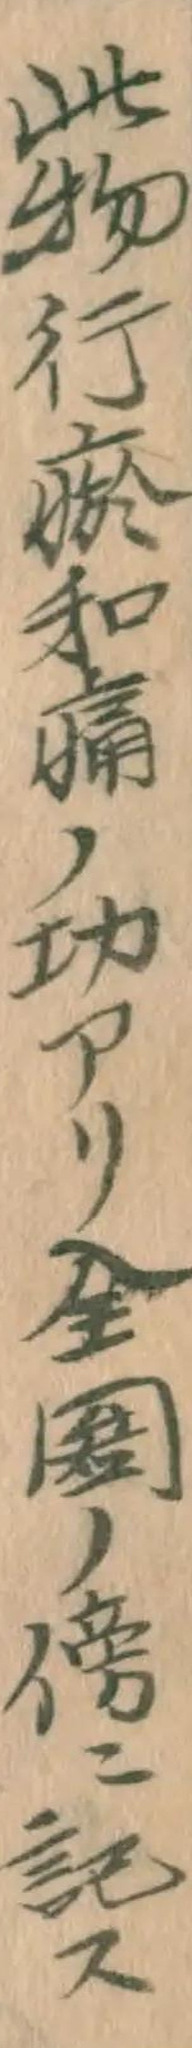此物行瘀和痛ノ功アリ全圗ノ傍ニ記ス
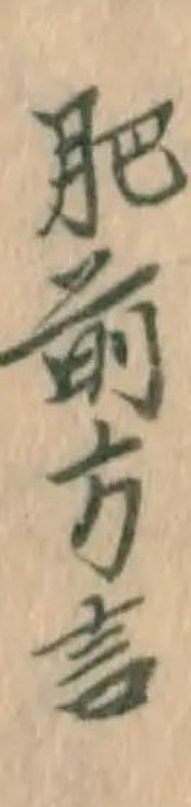肥前方言
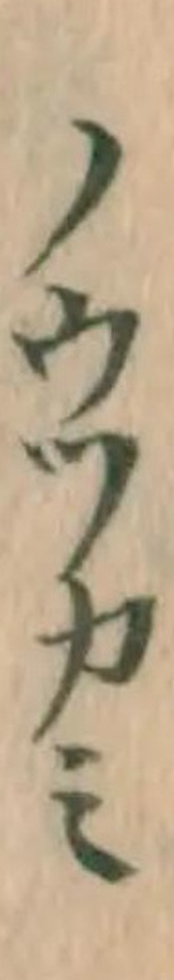ノウツカミ
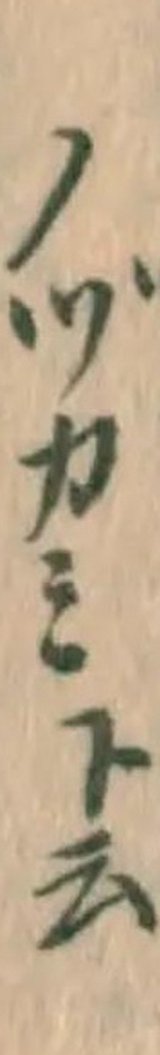ノヅカミト云
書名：千蟲譜 3巻. [1]
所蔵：国立国会図書館 National Diet Library, JAPAN
